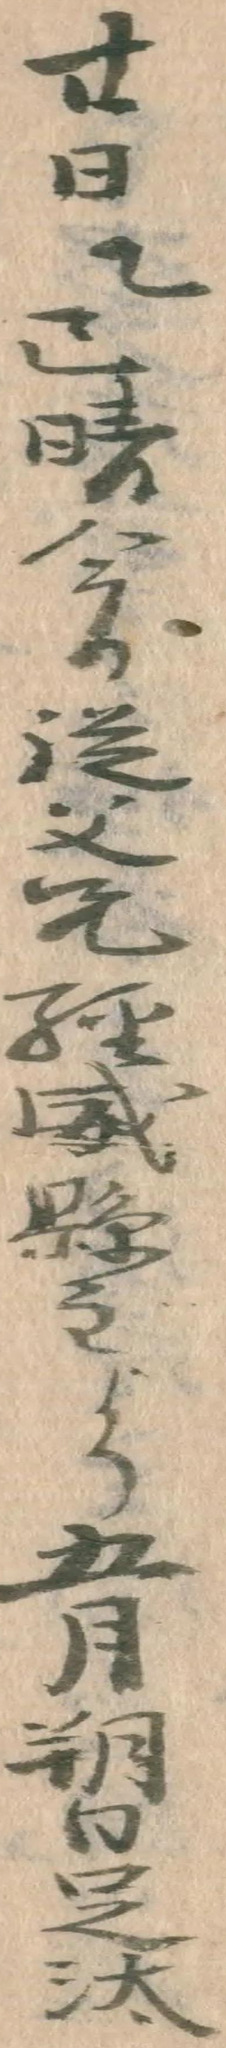廿日乙巳晴、今日従父兄経威縣主より、五月朔日足汰
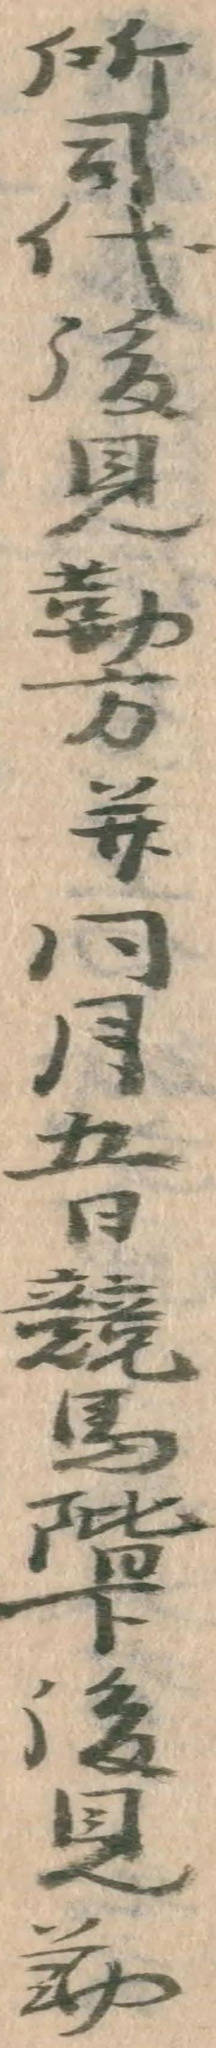所司代後見勤方并同月五日競馬階下後見勤
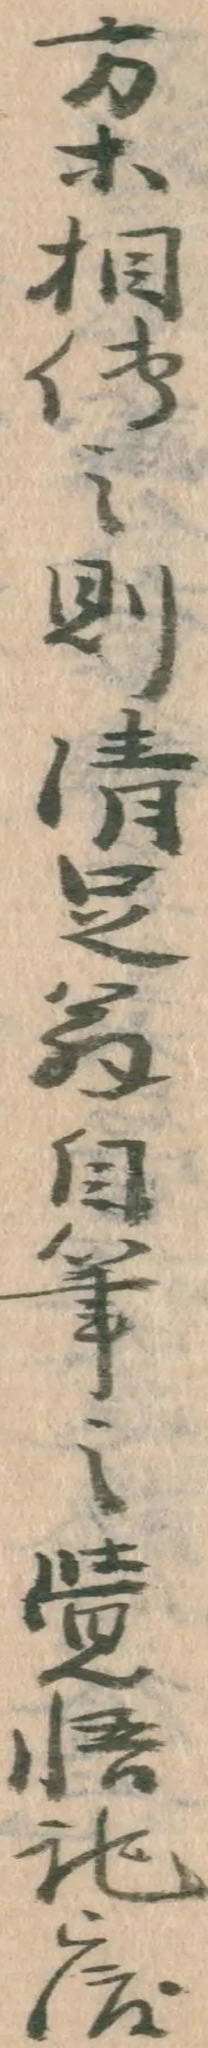方等相傳、則清足翁自筆之覚悟記被渡
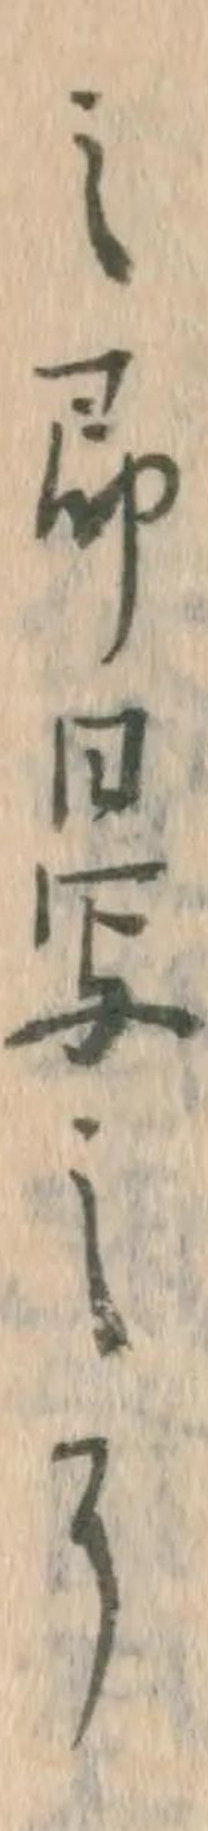之即日写之了、
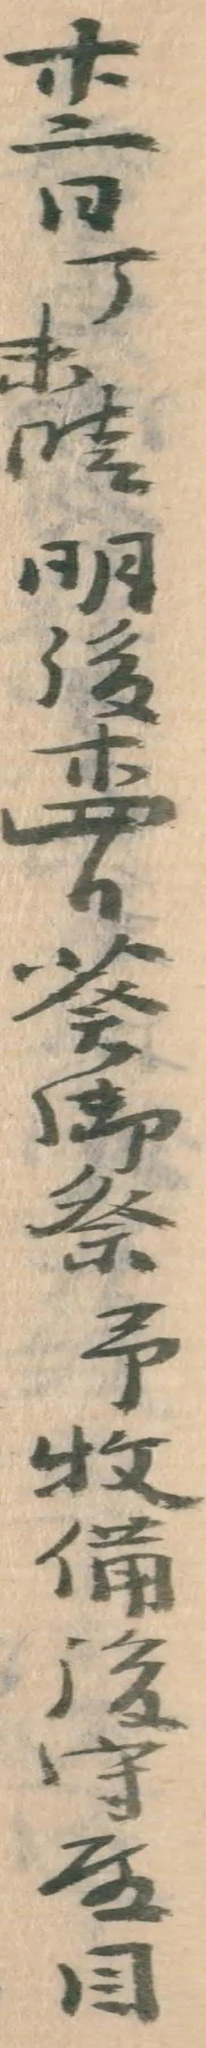廿二日丁未晴、明後廿四日葵御祭、予牧備後守殿目
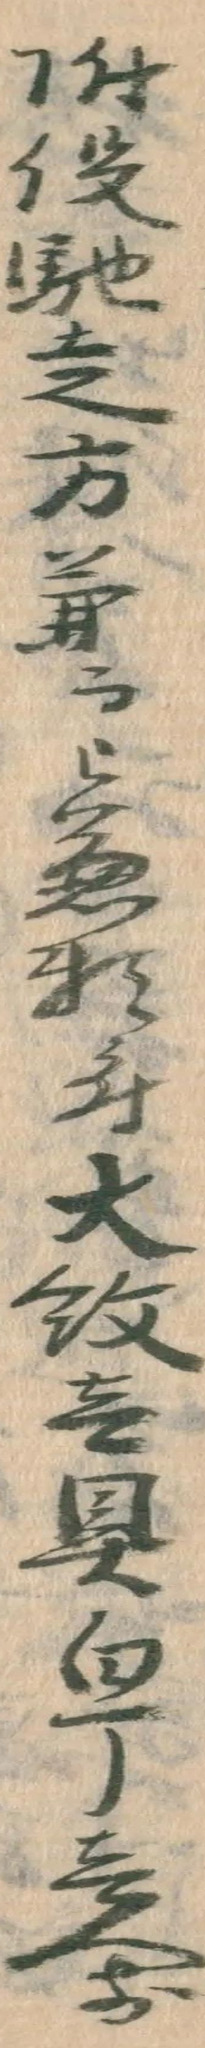附役馳走方、兼而被兼頼候付、大紋壱具・白丁壱人前
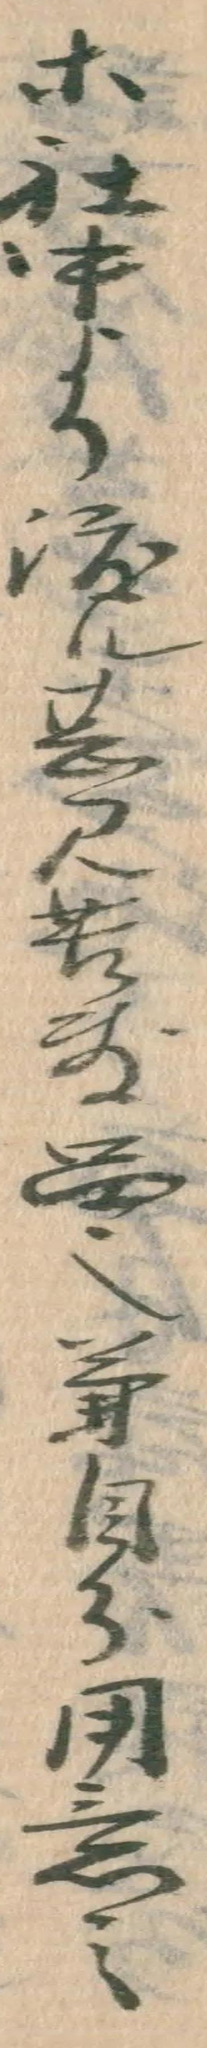等社中より渡る、甚見苦敷品也、兼自分用意之
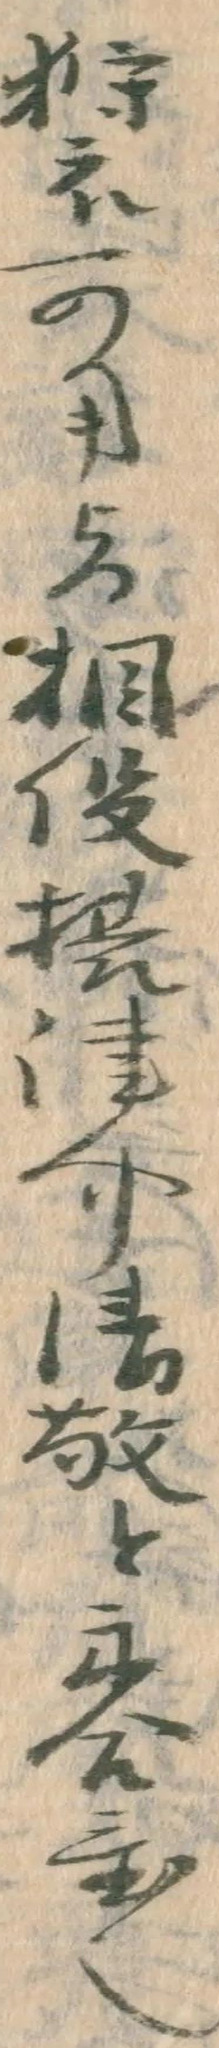狩衣可用旨相役摂津介清敬と示合置之、
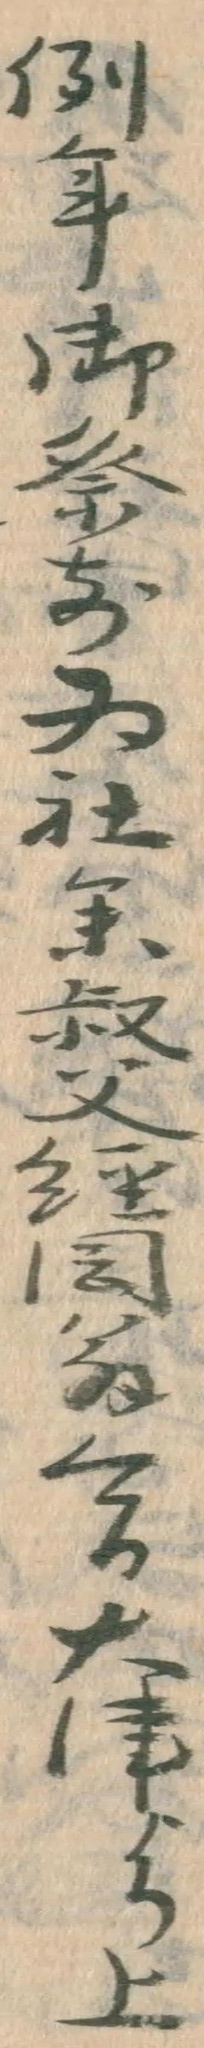例年御祭前、為社参叔父経岡翁、今日大津より上
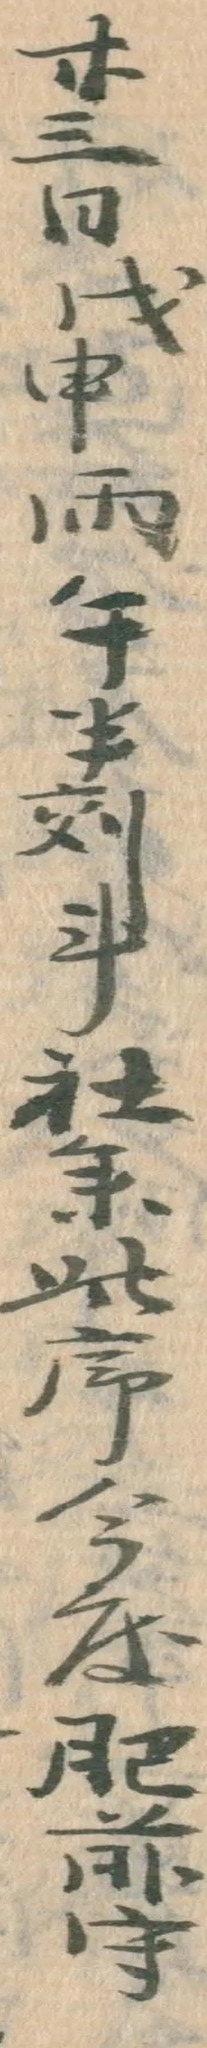廿三日戊申雨、午半刻斗社参、此序、今度肥前守
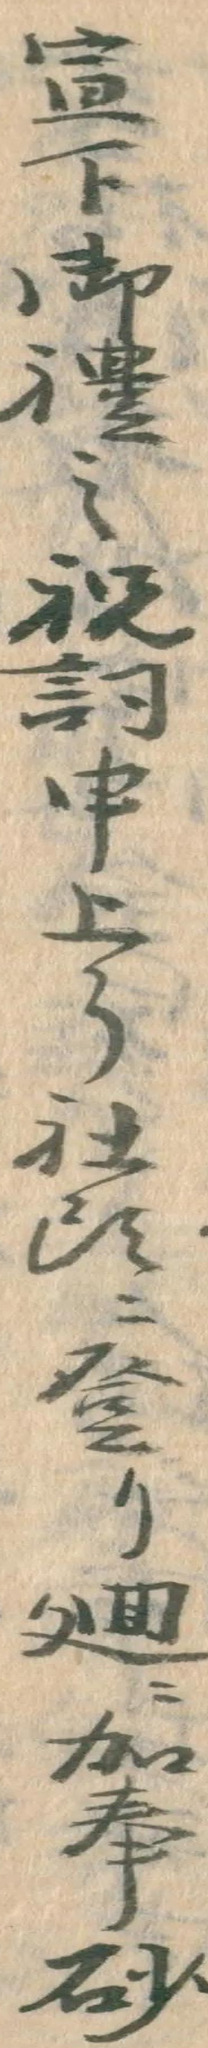宣下御礼之祝詞申上了、社頭に登り廻ニ加奉砂
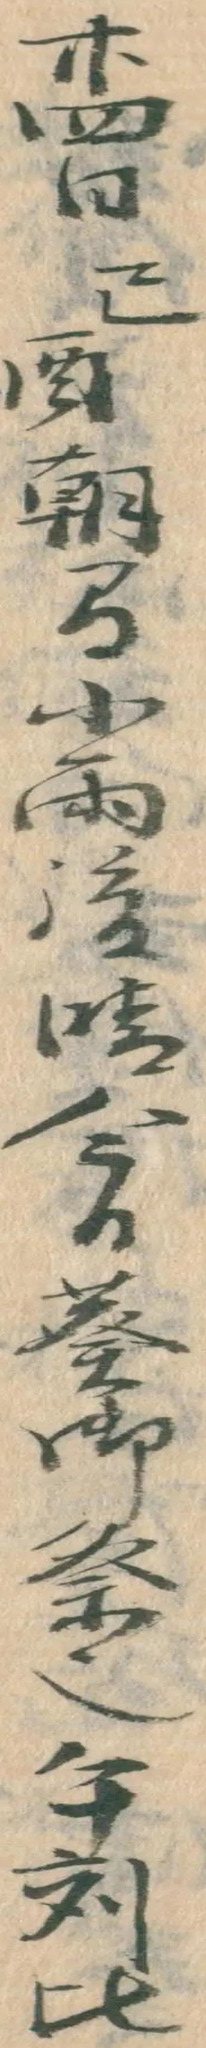廿四日己酉朝間小雨後晴、今日葵御祭也、午刻比
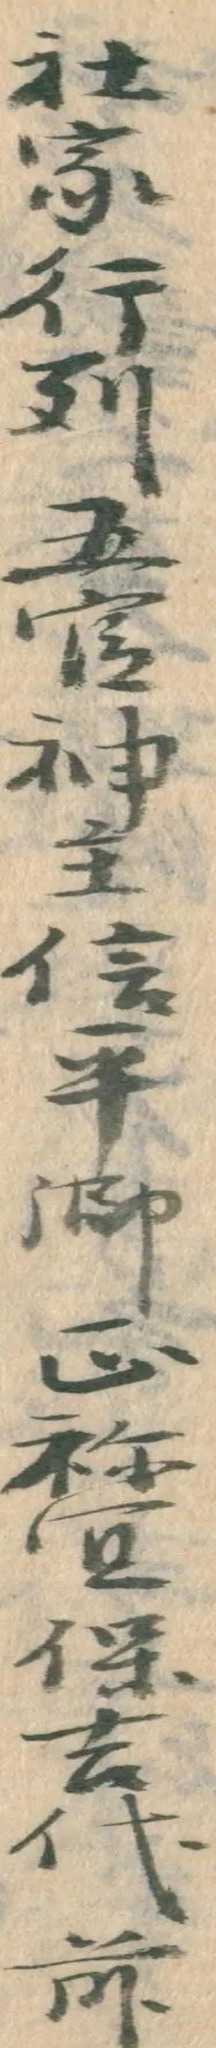社家行列、五官神主信平卿・正称宜保吉代前
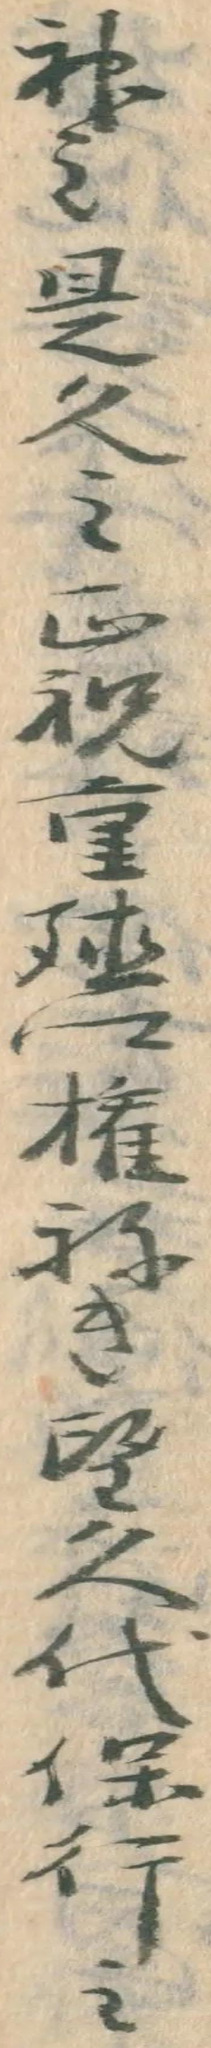神主是久之・正祝重徳卿・権ねき望久代保行之・

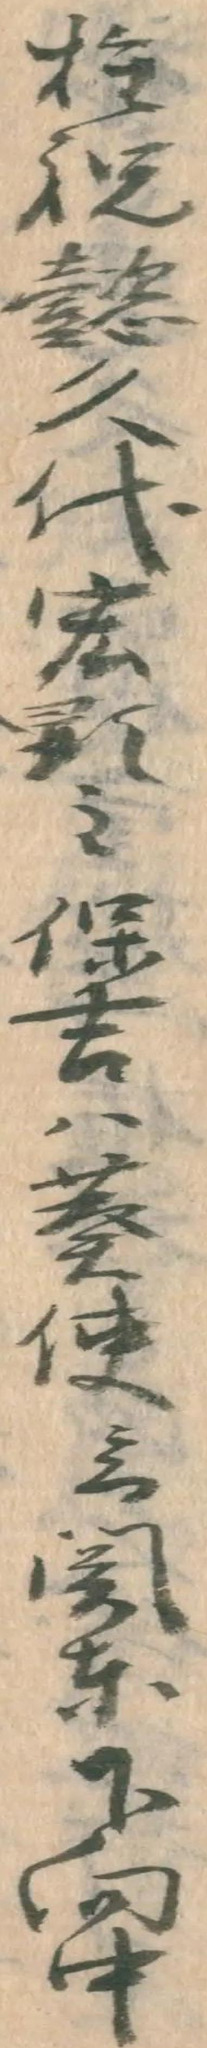権祝懿久代宏顕主、保吉ハ葵使ニ而関東下向中、
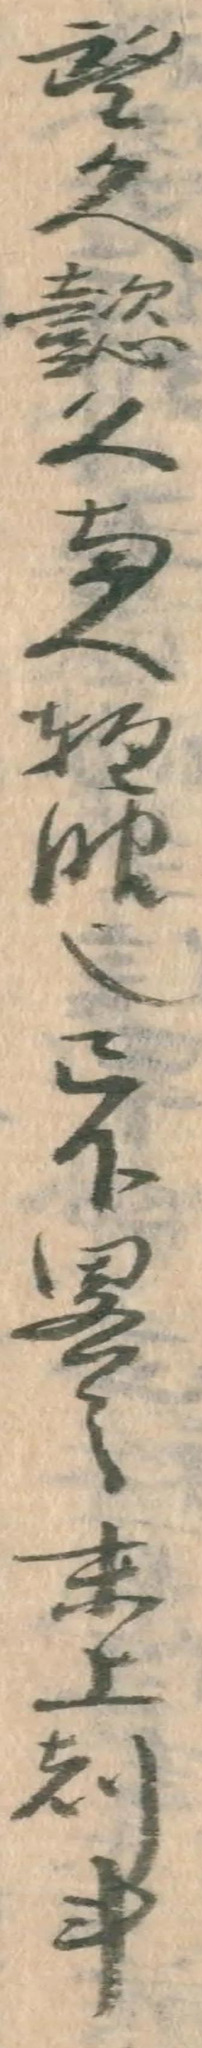望久・懿久両人軽服也、已下略之、未上刻計
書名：賀茂社記録. 第63冊
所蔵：国立国会図書館 National Diet Library, JAPAN
